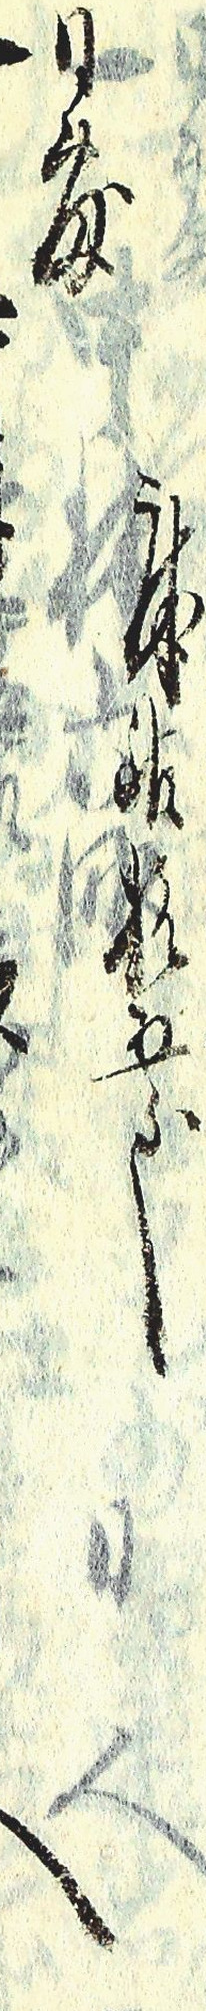床銀拾五匁
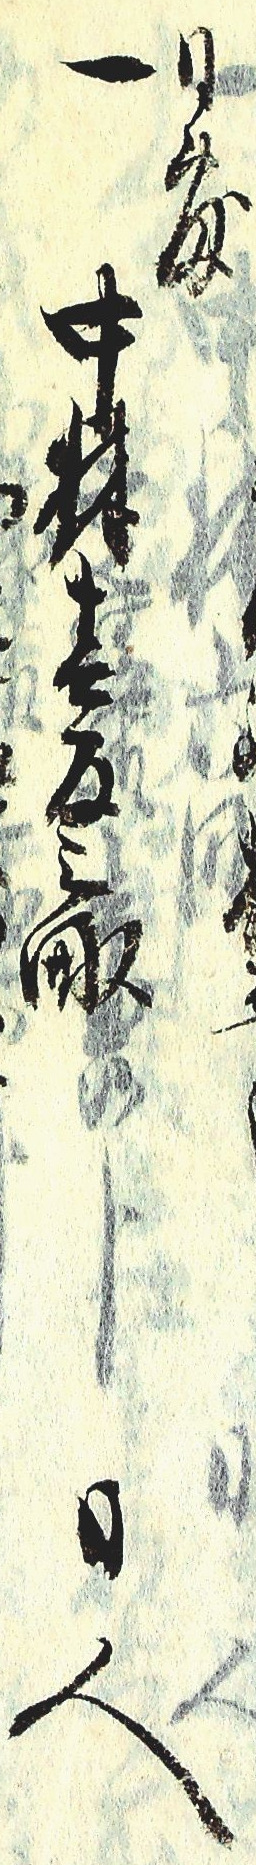一中林壱反三畝同人
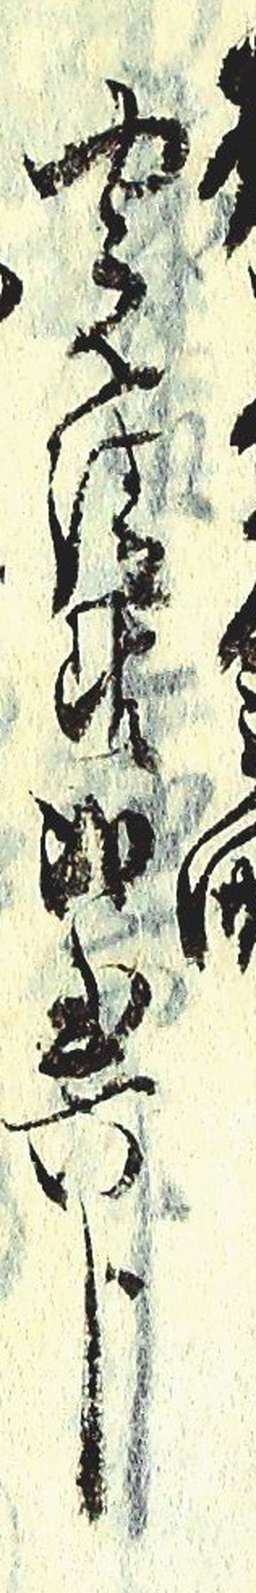定請銀弐匁六分
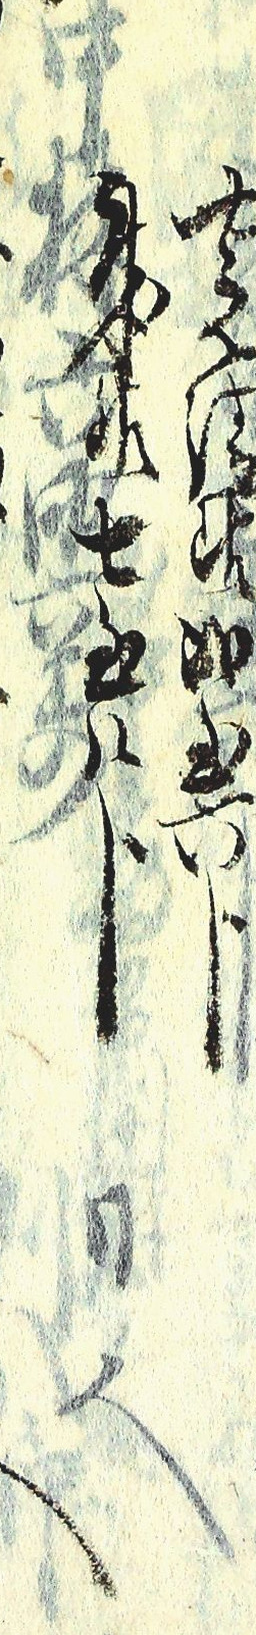床銀七匁八分
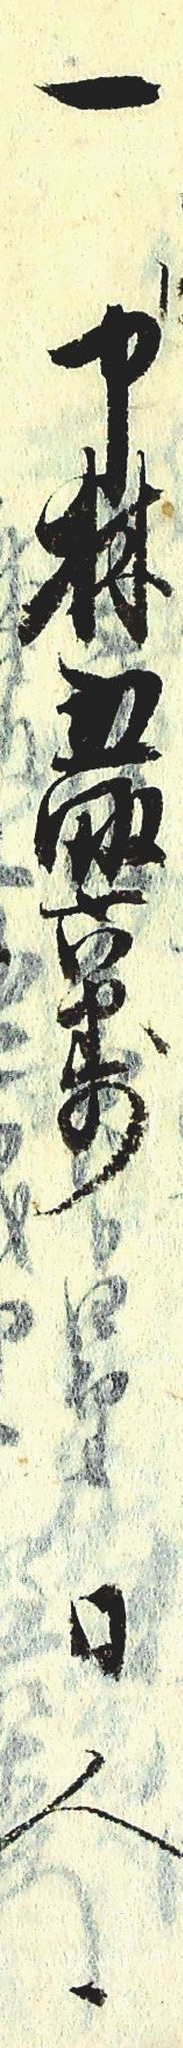一中林五畝六歩同人
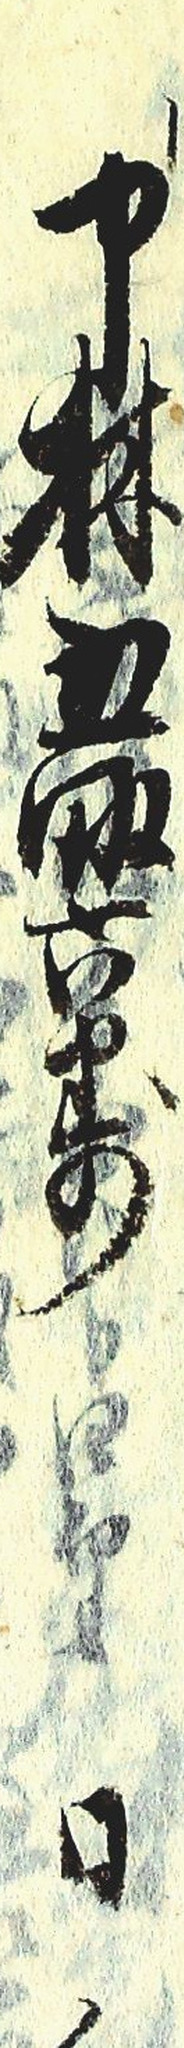一中林五畝六歩同人
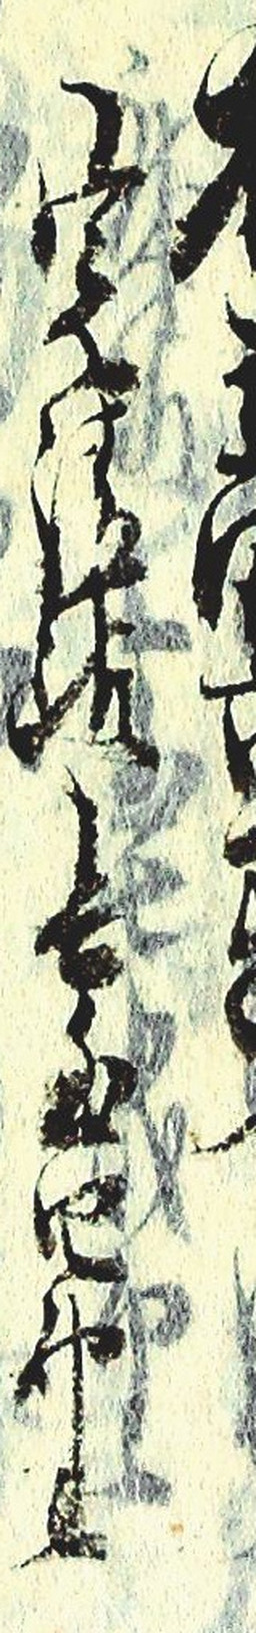定請銀壱匁四厘
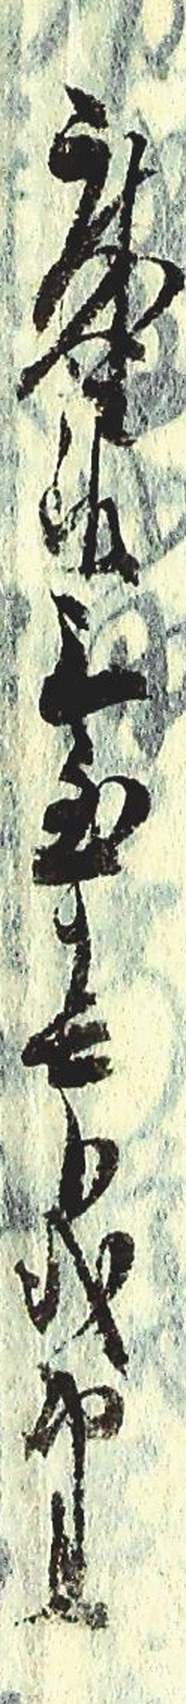床銀三匁壱分弐厘
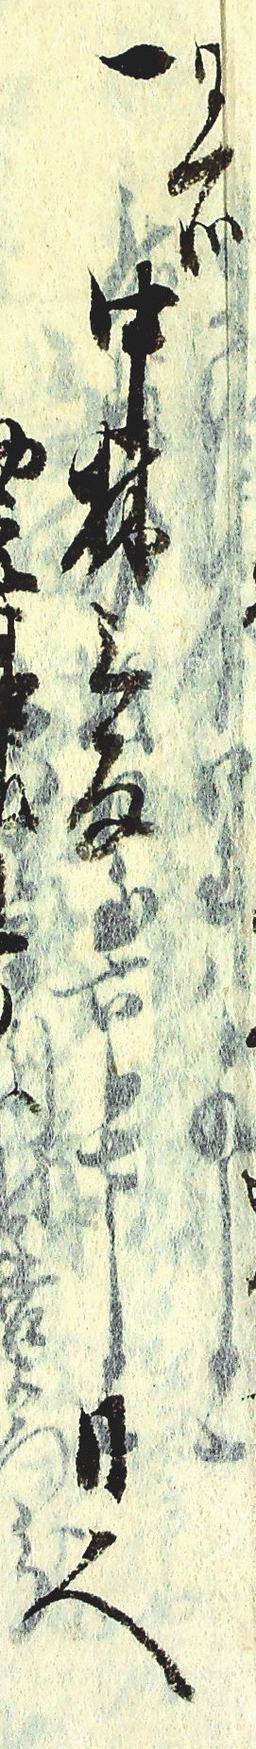一中林三反同人
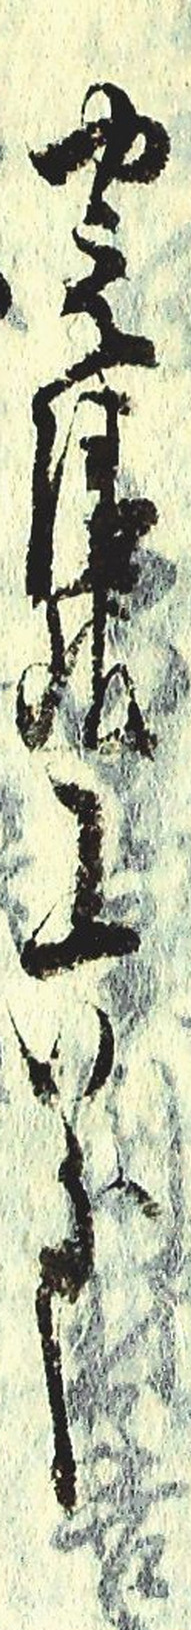定請銀六匁
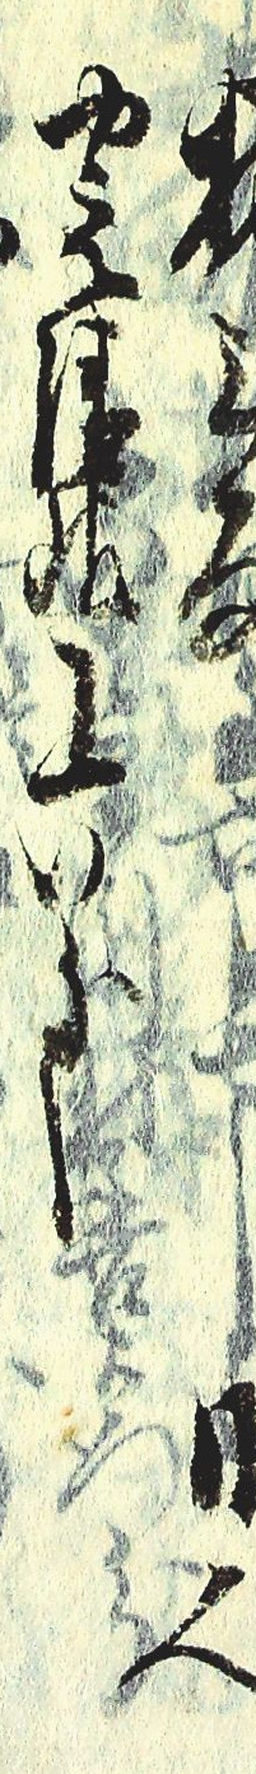定請銀六匁
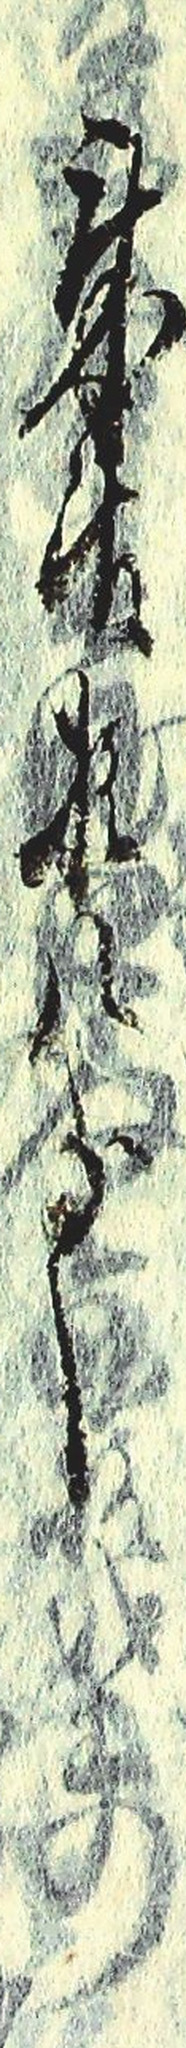床銀拾八匁
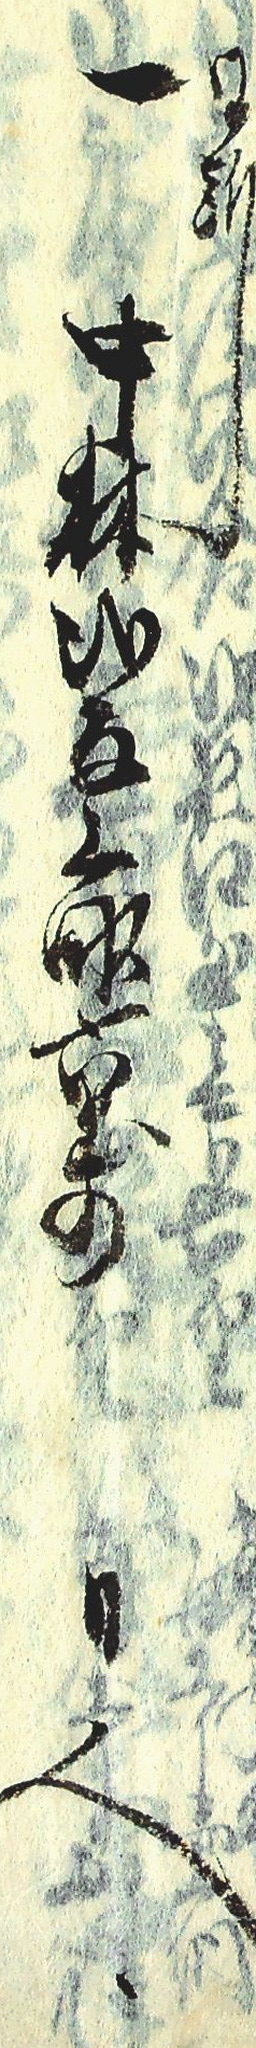一中林弐反三畝六歩同人
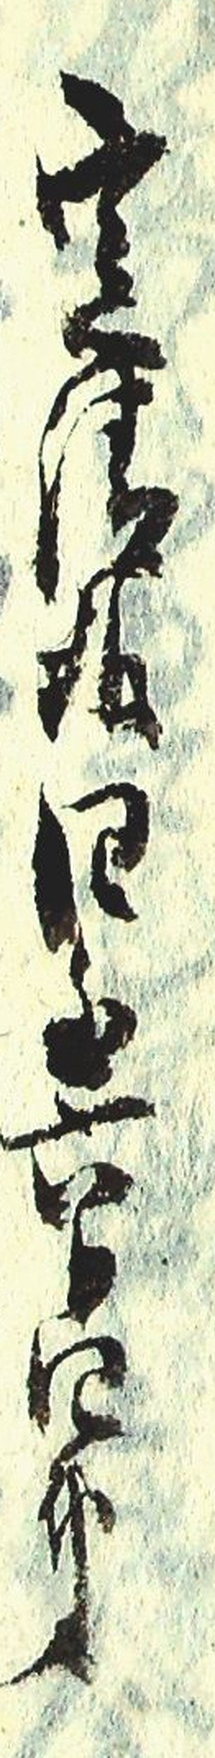定請銀四匁六分四厘
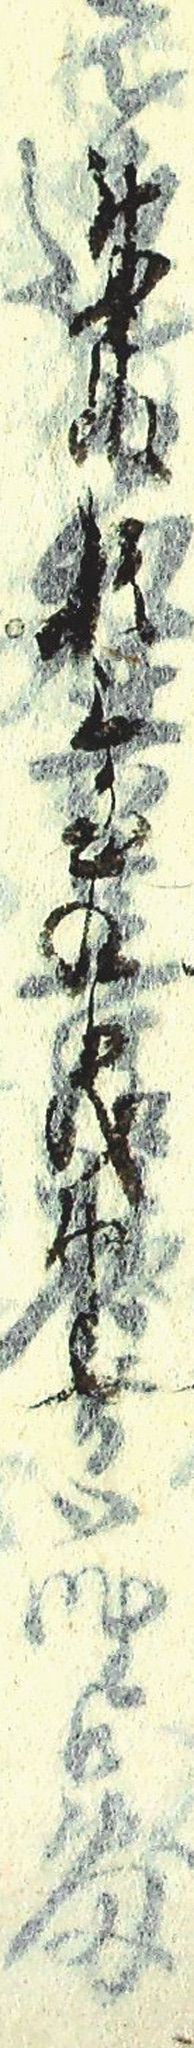床銀拾三匁九分弐厘
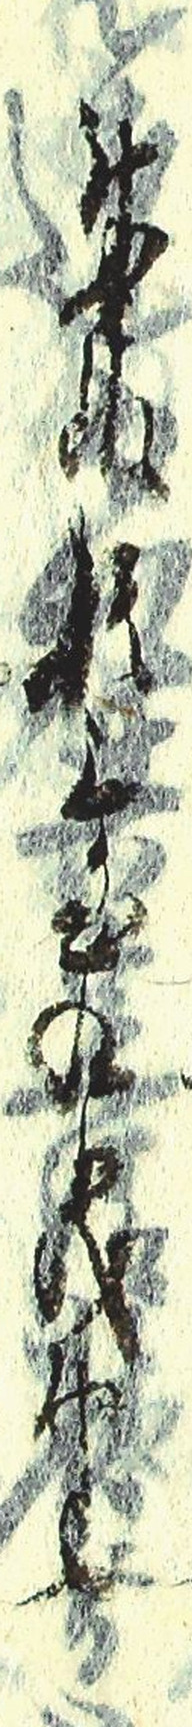床銀拾三匁九分弐厘
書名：諸御願書控(弐番）
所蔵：鳴門教育大学 Naruto University of Education
